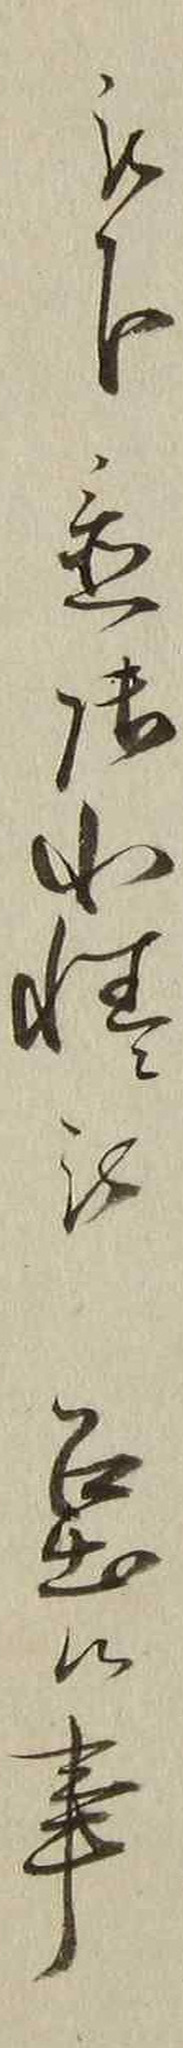被下置御小性に被召出候事
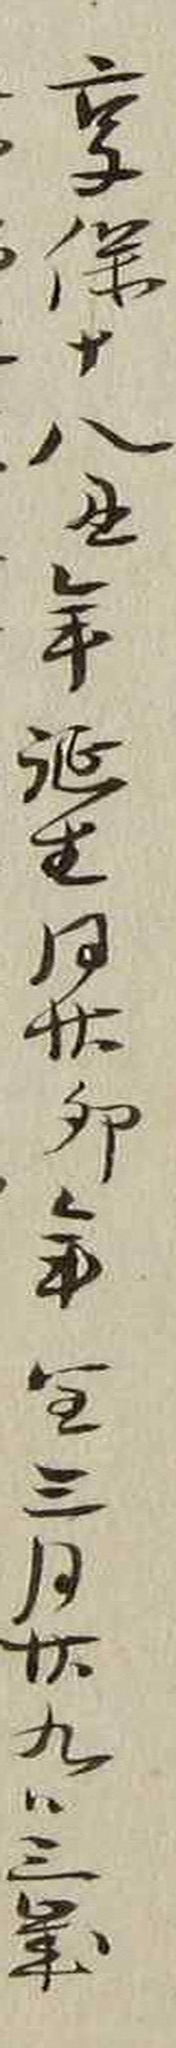大蔵享保十八丑年誕生同廿卯年閏三月廿九日三歳
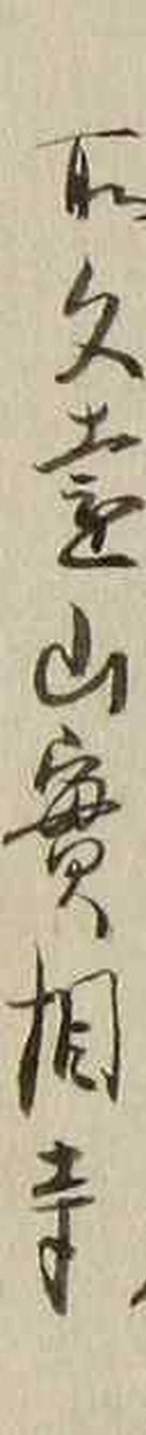所久遠山実相寺
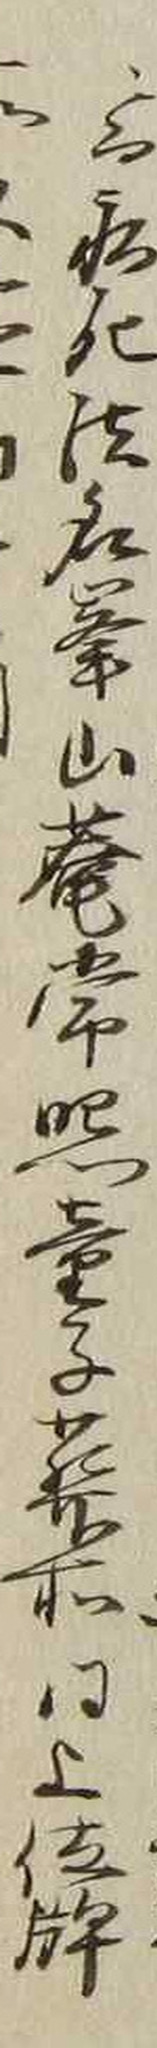に而病死法名峯山菴常照童子葬所同上位牌
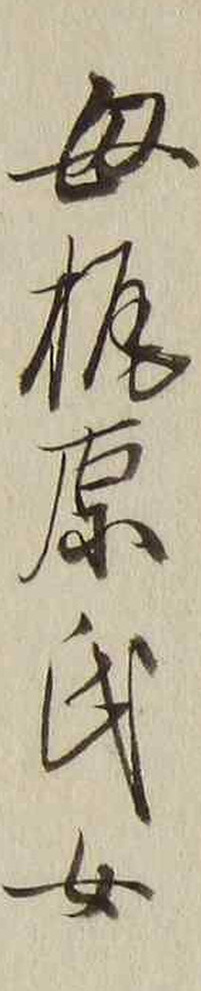母梶原氏女

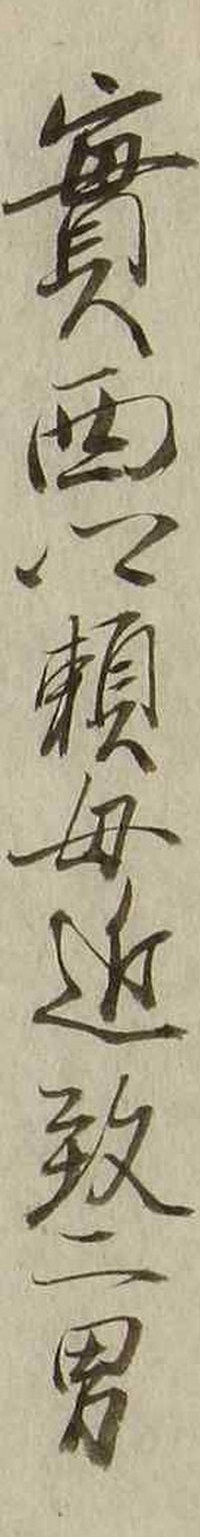実西郷頼母近致二男
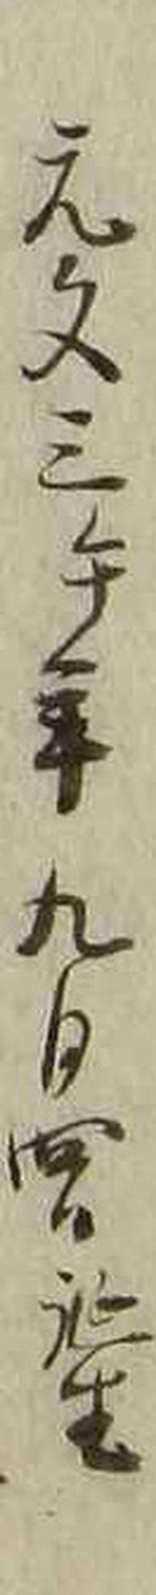元文三午年九月四日誕生
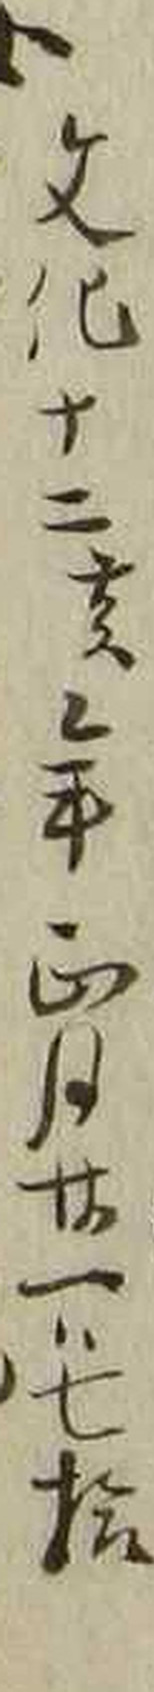文化十二亥年正月廿一日七拾
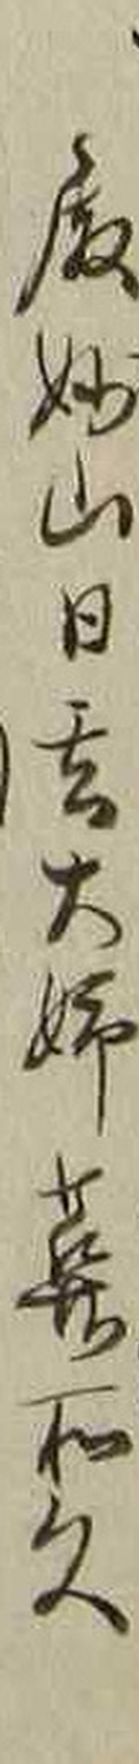殿妙山日玄大姉葬所久
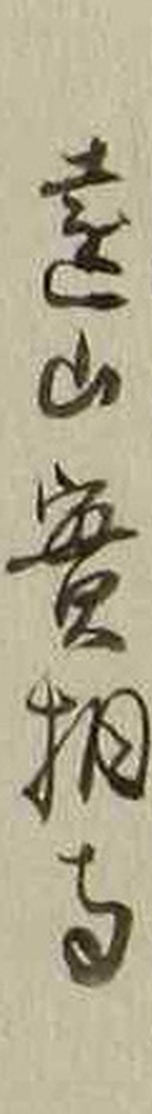遠山実相寺
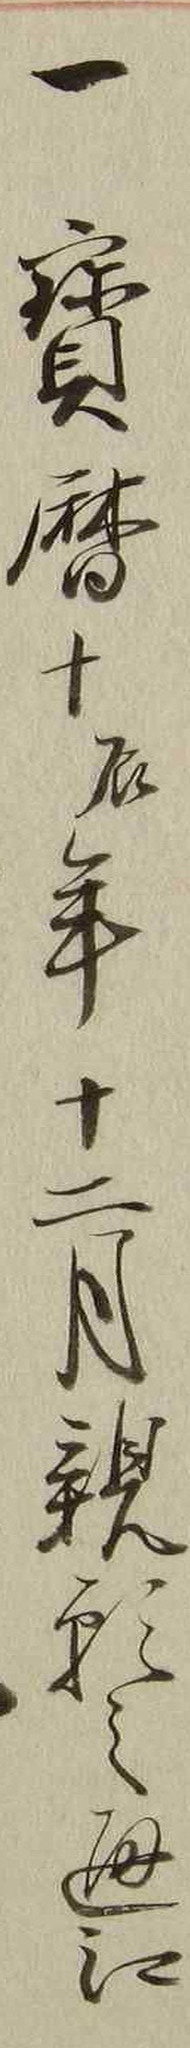一宝暦十辰年十二月親願之通江
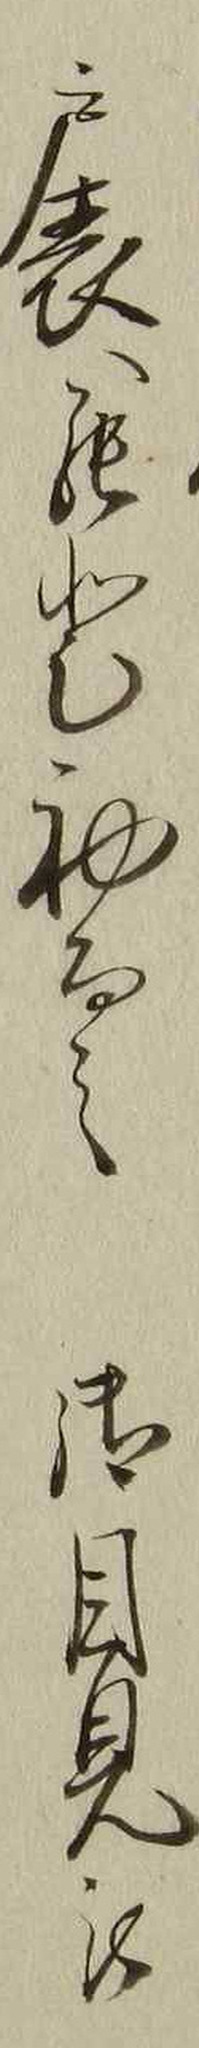戸へ罷登初而之御目見被
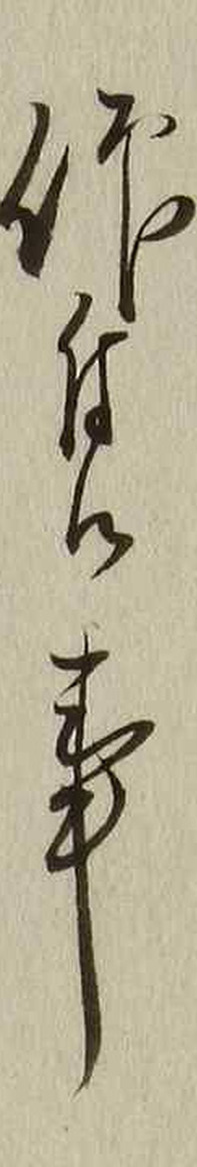仰付候事
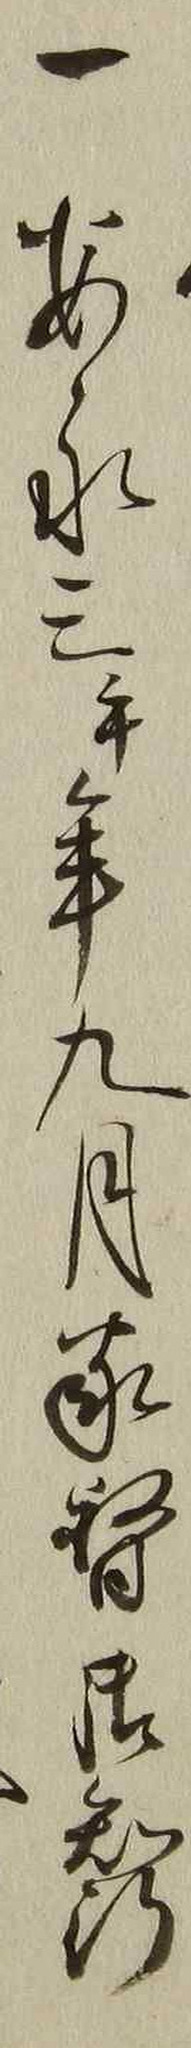一安永三午年九月家督御知行
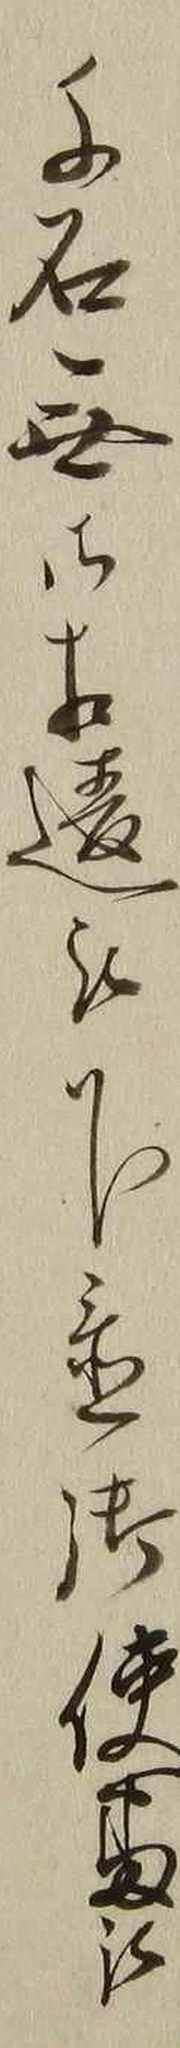千石無御相違被下置御使番被
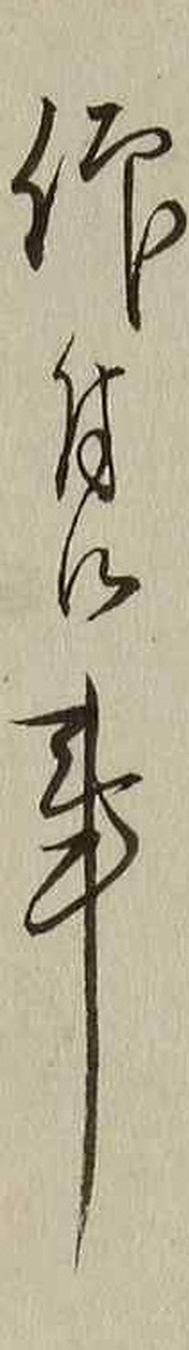仰付候事
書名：諸士系譜　巻之103　か之部11
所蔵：会津若松市立会津図書館
